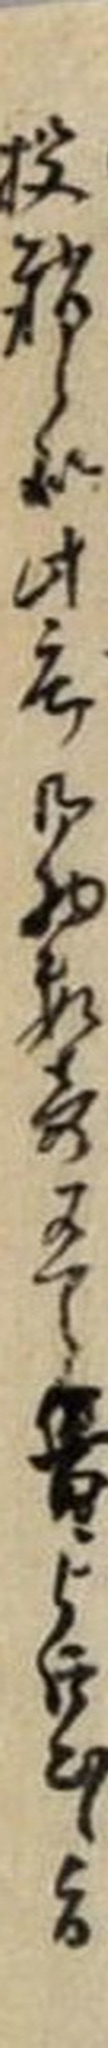投鞘之処此度御物数寄有之筈に被仰出候旨
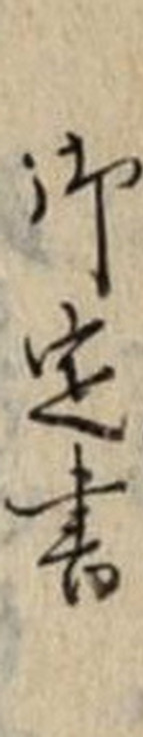御定書
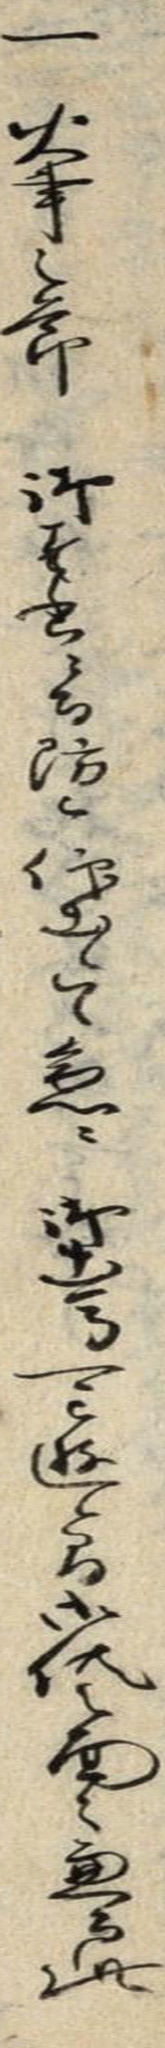一火事之節御奉書にて防被仰出候はゝ急に御出馬可被遊候間御供之面々兼て此
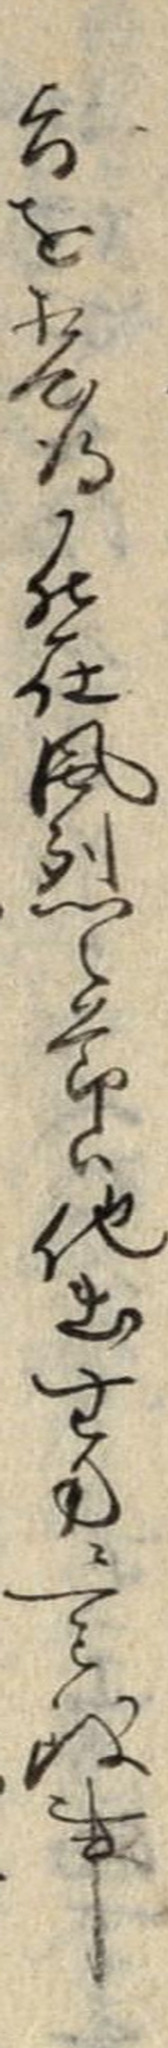旨を相心得罷在風烈之節は他出無用に可被致事
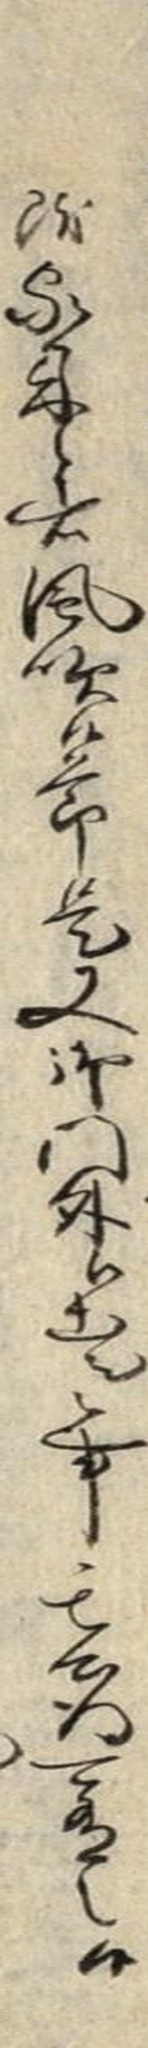附家来之者風吹候節是又御門外江出し候事其心得可有之候
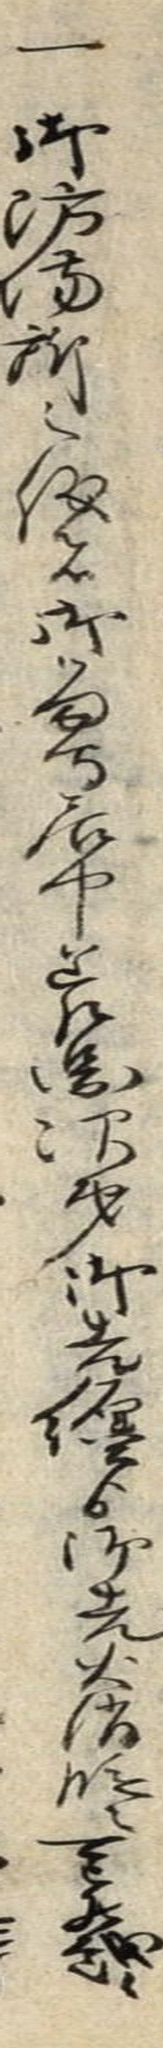一御防場所之儀は御留守居中差図次第御先纏ゟ御先火消段々可被罷越候
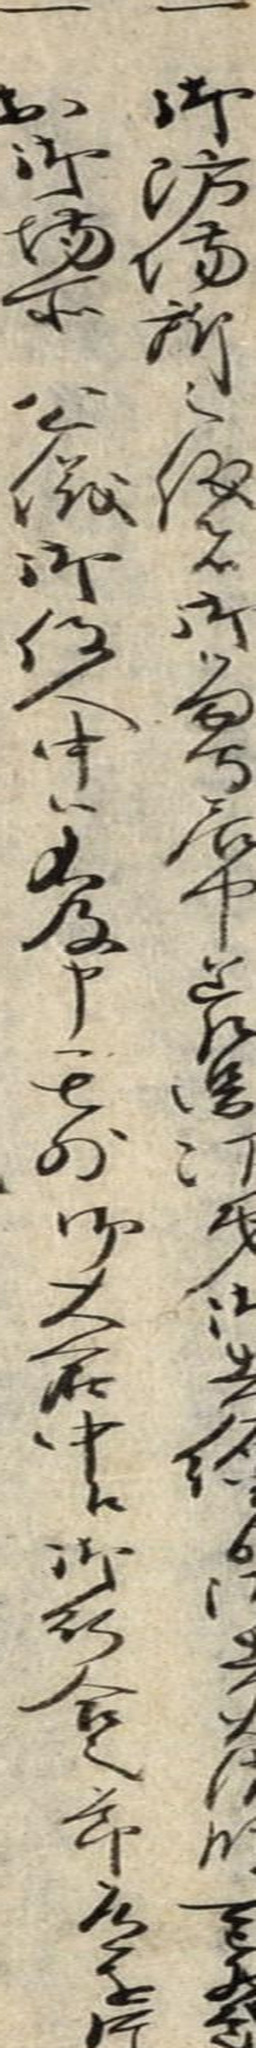一於御場所公儀御役人中は不及申其外御大名中江御行合之節道を片
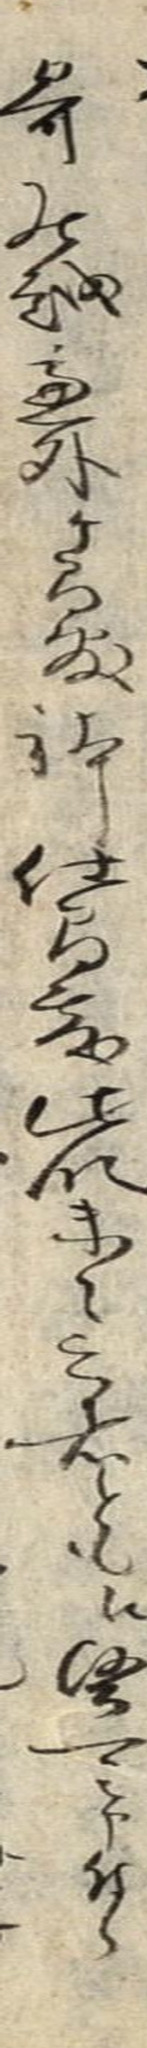寄罷越慮外ケ間敷体仕間敷此段末々之者とも江堅可被申付候
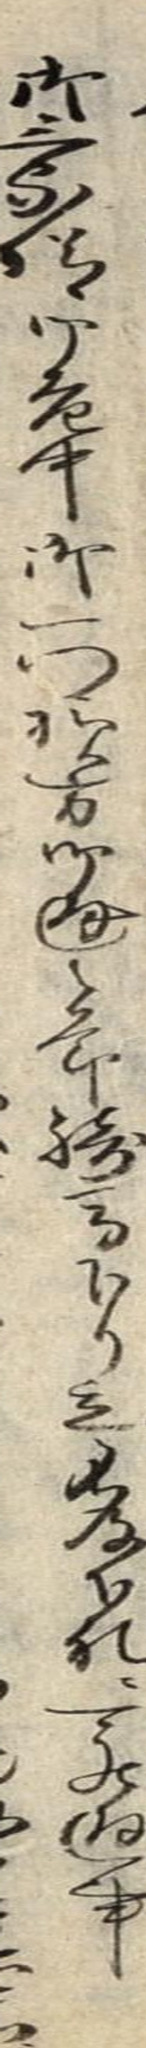御三家様御老中御一門様方御通之節騎馬下り立不及下礼に可罷通事
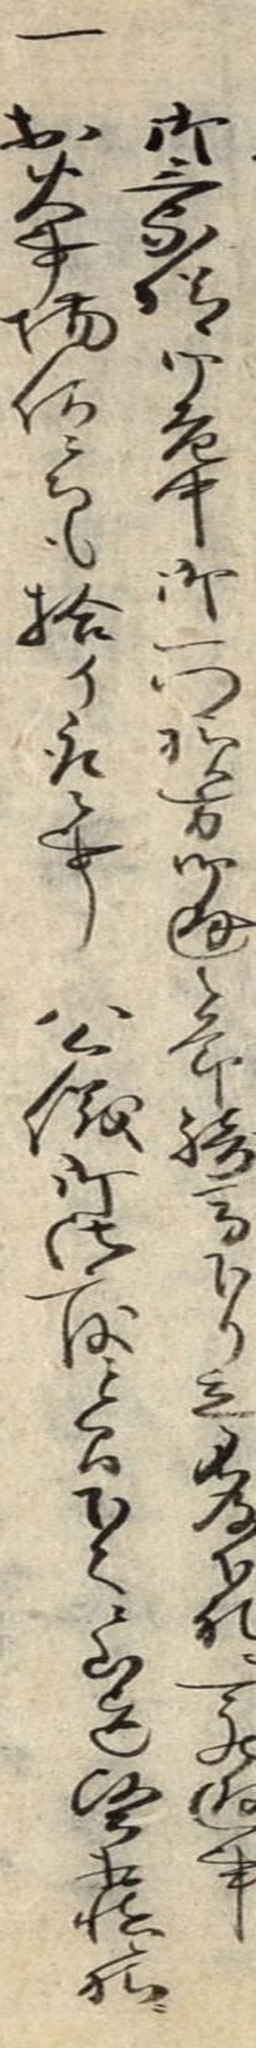一於火事場何にても拾い取候事公儀御法度に候間下々に至迄堅相慎候様に
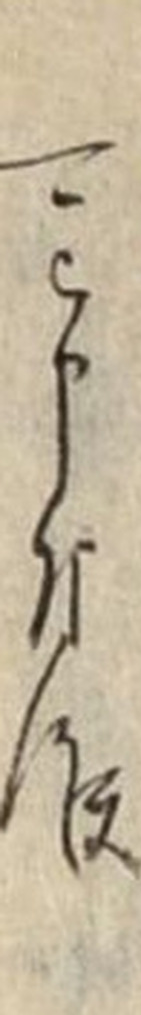可被申付候
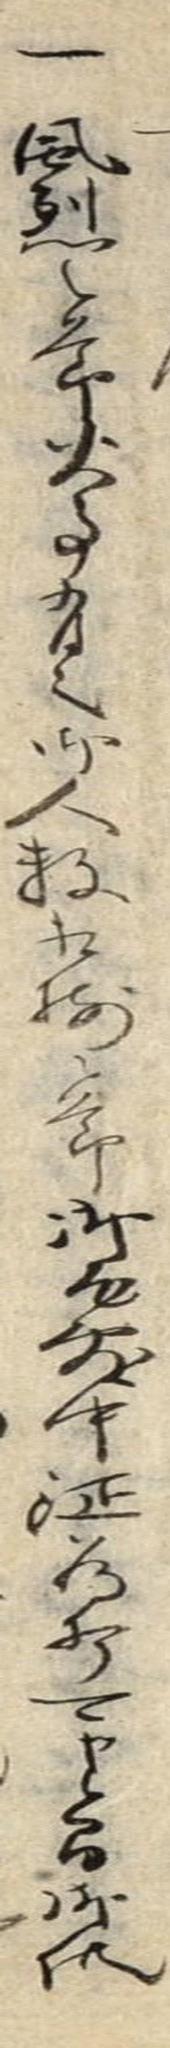一風烈之節火事有之御人数相揃之節御屋敷中鉦為打可申候間御供
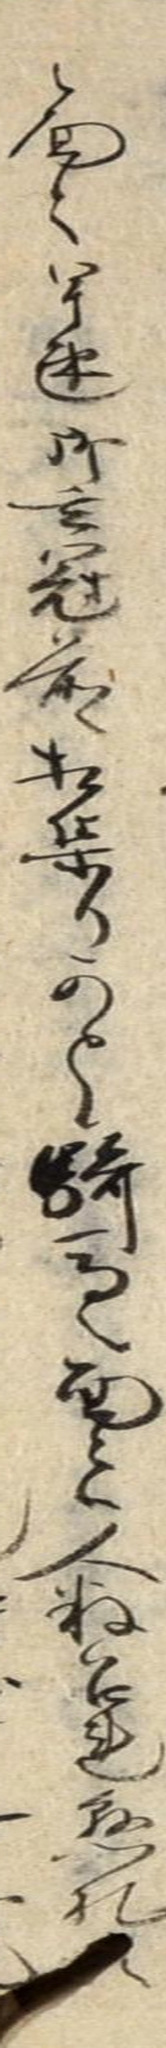之面々早速御玄冠前へ相集り可申候騎馬之面々は人数召連懸札之
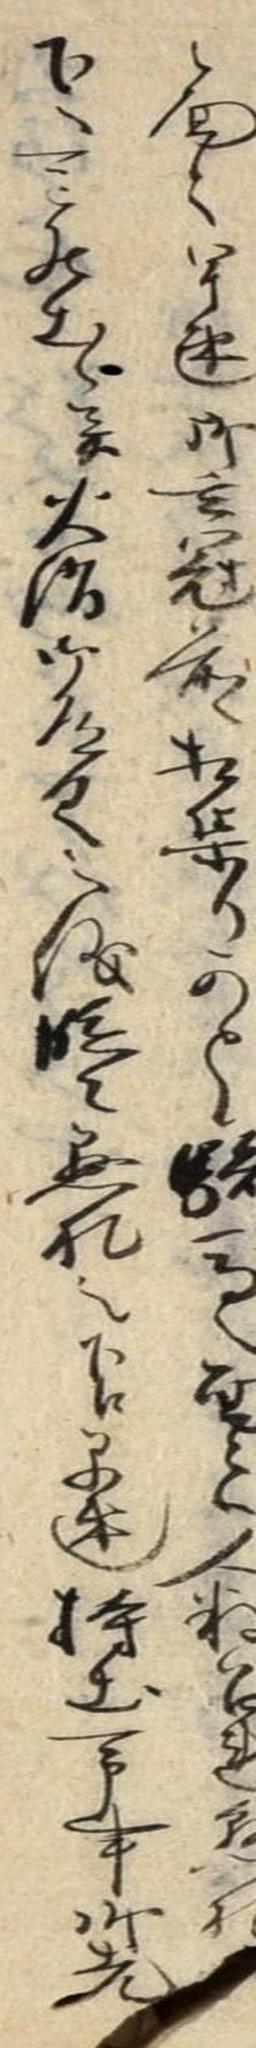下へ可被罷出候并火消御道具之儀段々懸札之下江早速持出可申事御先

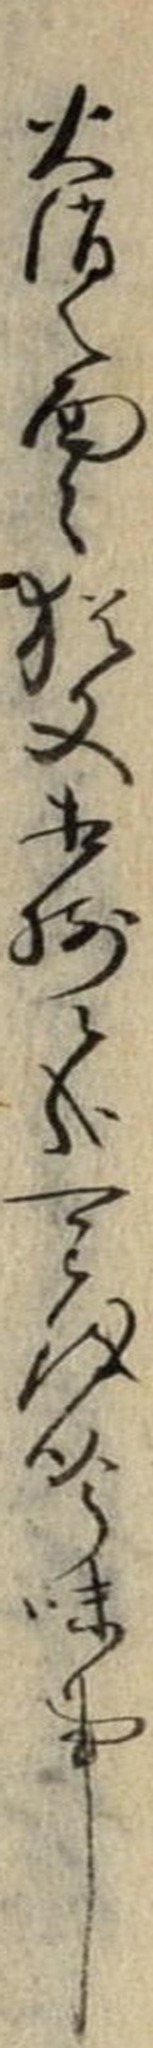火消之面々猶又相揃候哉可被致吟味事
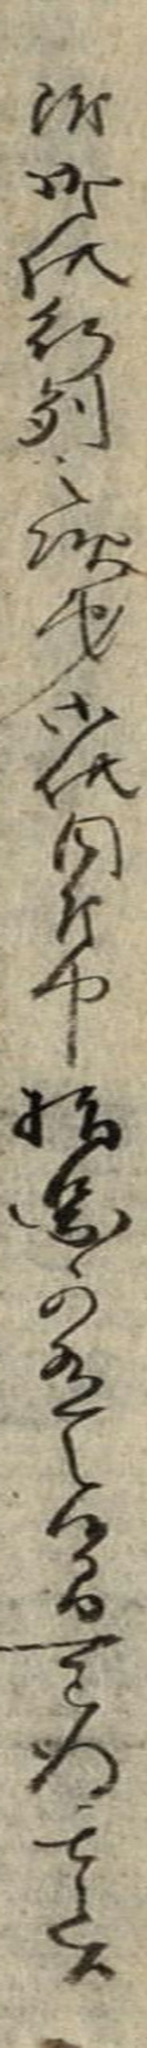附御供行列之次第御供目付中指図可有之候間可被得其意候
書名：三都并道中之部
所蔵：福井県文書館 Fukui Prefectural Archives
